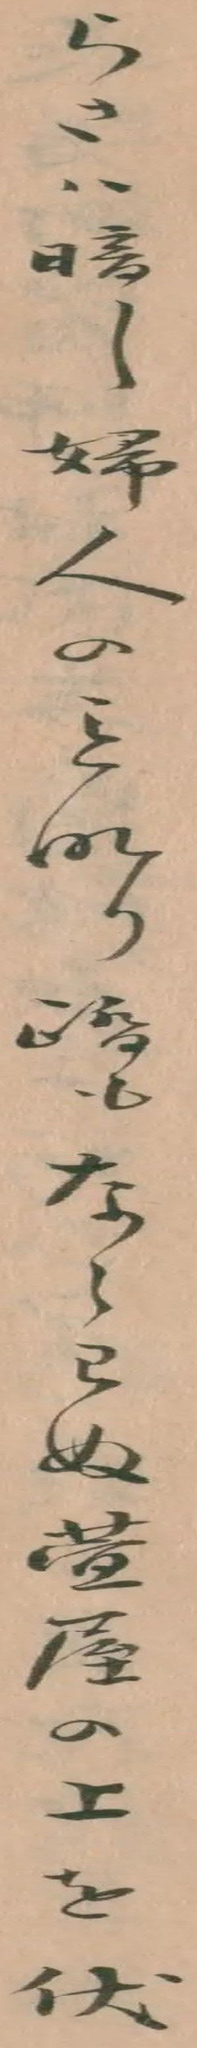らさハ暗し婦人のことなり踏もならわぬ萱屋の上を伏
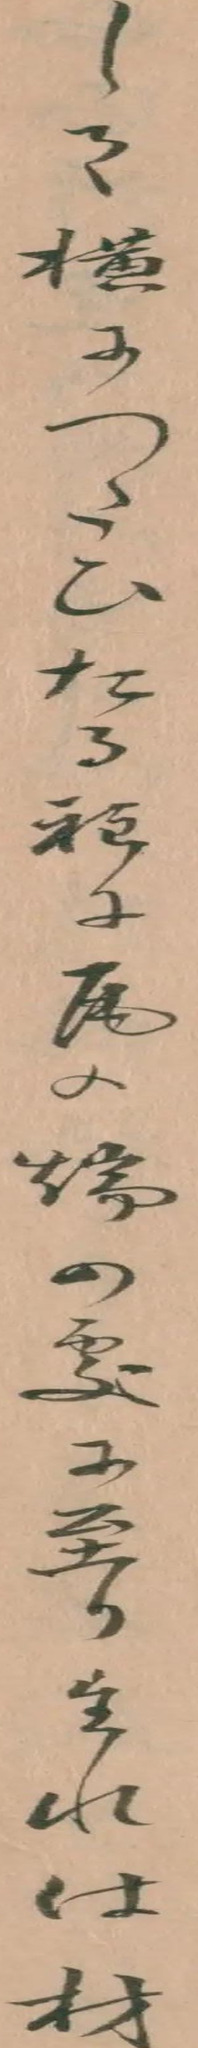して横につたいたる程に瓦の端の処に至りたれハ材
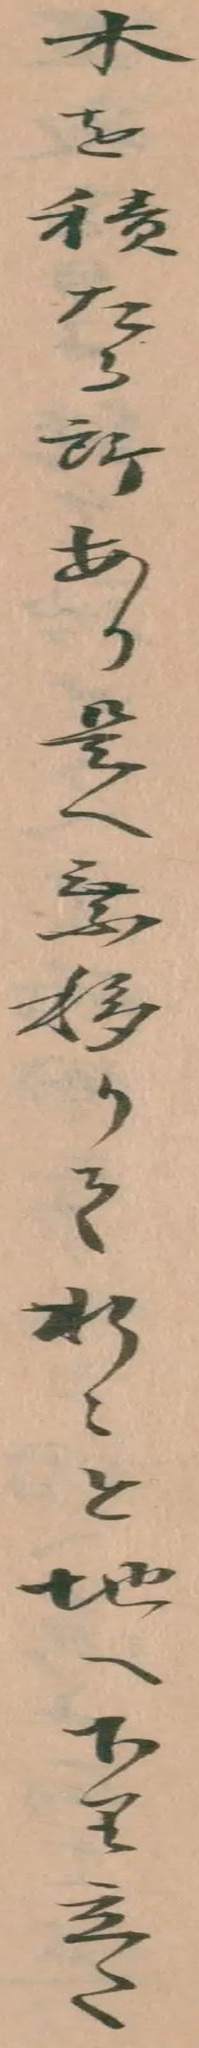木を積たる所あり是へ乗移りて漸々と地へ下り立た
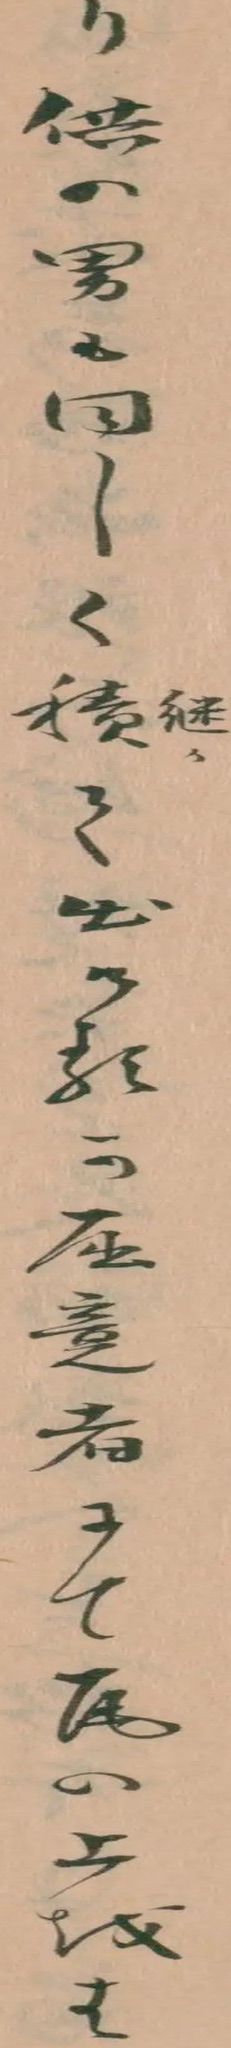り供の男も同しく継て出たるか屈竟にて瓦の上をは
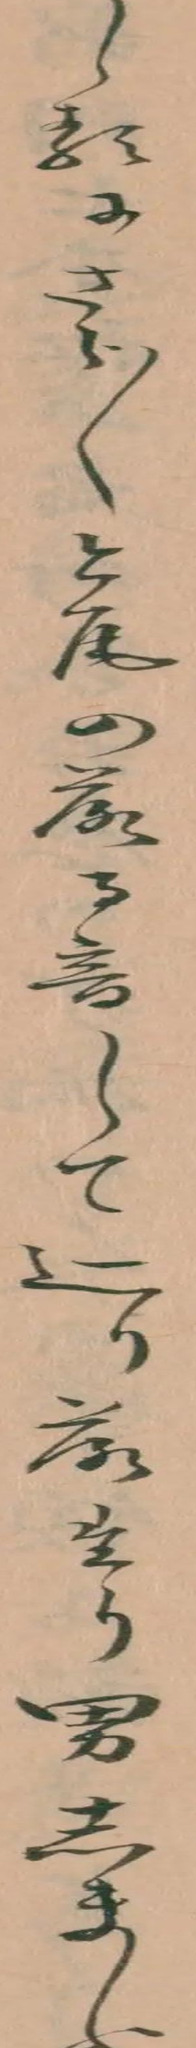しるにさら〳〵と瓦の落る音して辷り落たり男しまふ
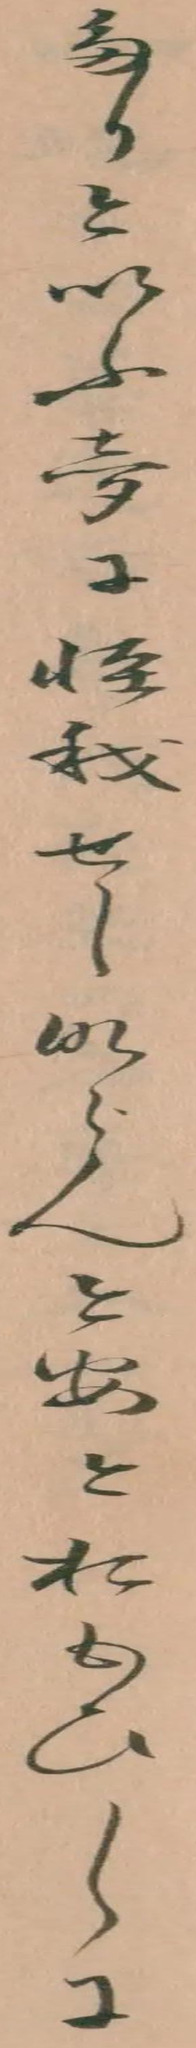たりといふ声に怪我せしならんと母はおもひしに
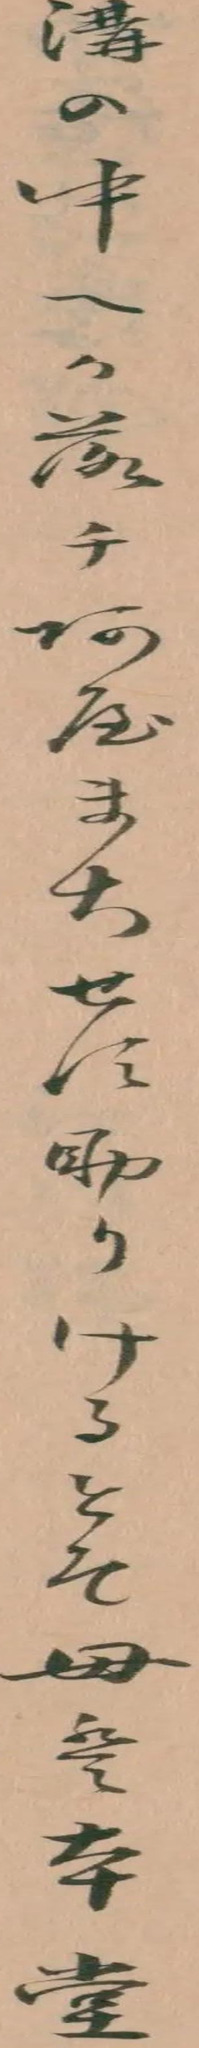溝の中へか落チあやまちせす助りけるとそ母は本堂
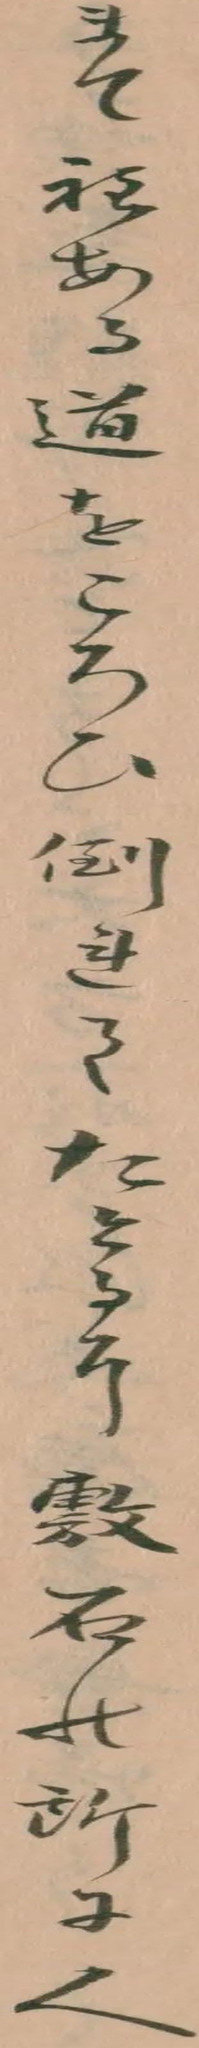まて程ある道をころび倒れてたとるに敷石の所に人
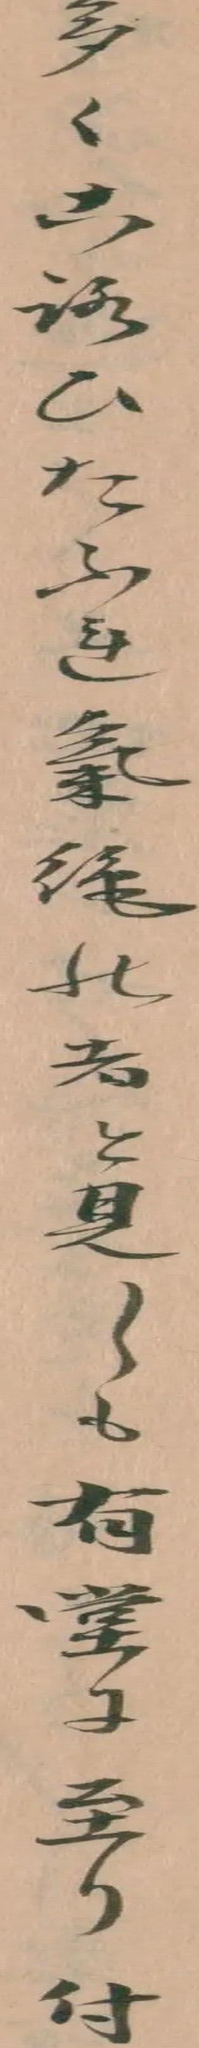多くころひたふれ気絶の者と見しも本堂に至り付
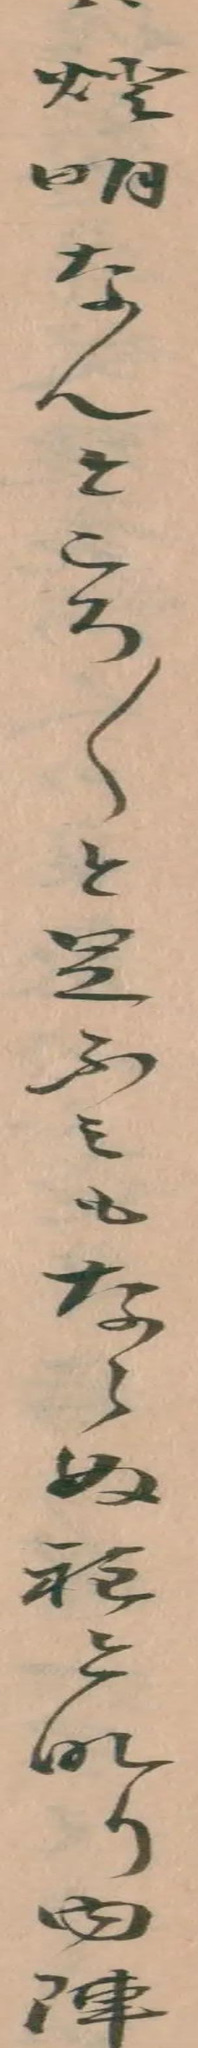ハ燈明なんところ〳〵と足ふミもならぬ程となり内陣
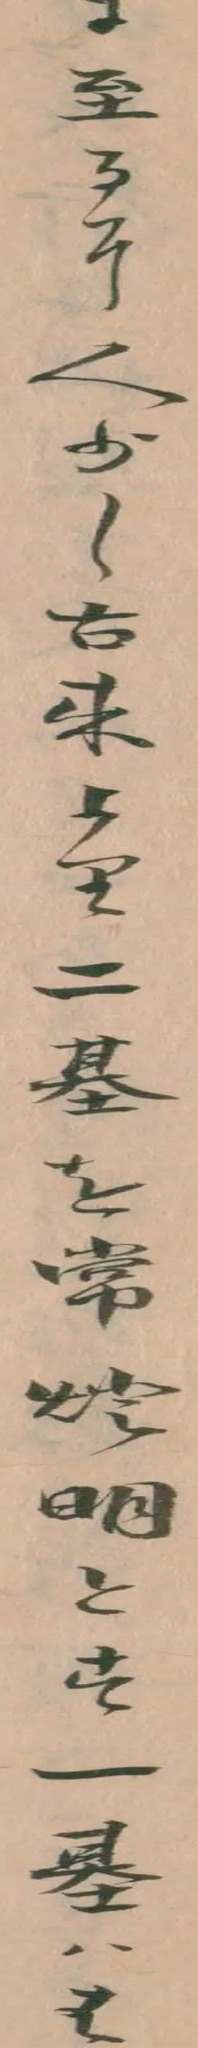に至るに人少し古来より二基を常燈明とす一基ハは
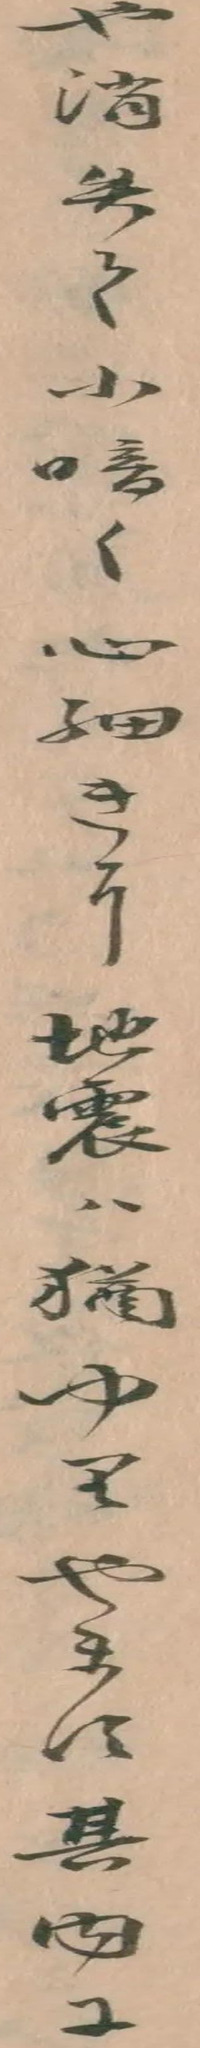や消失て小暗く心細きに地震ハ猶ゆりやます其内に
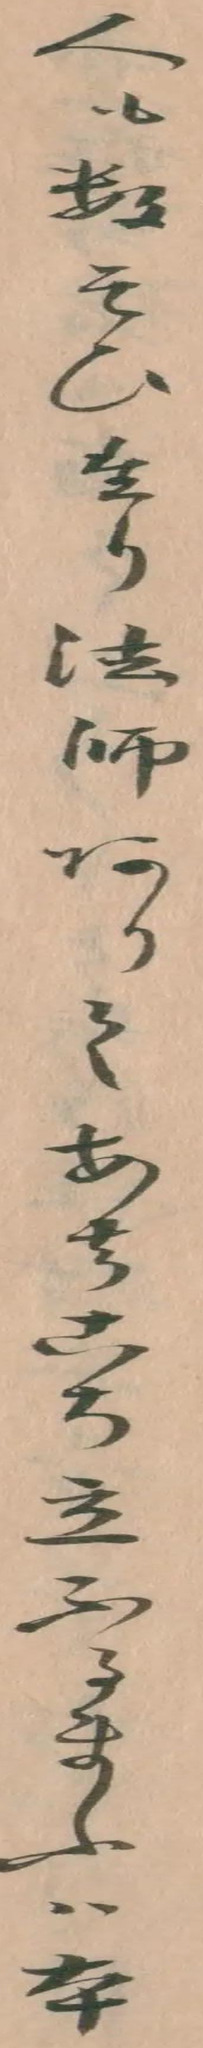人も数しひなり法師ありてあちこち立ふるまふハ本
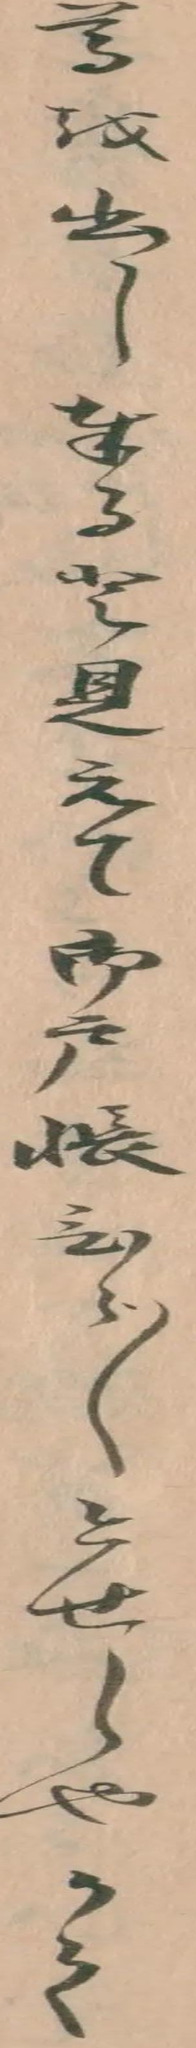尊を出し奉ると見えて御戸帳ひら〳〵とせしやかて
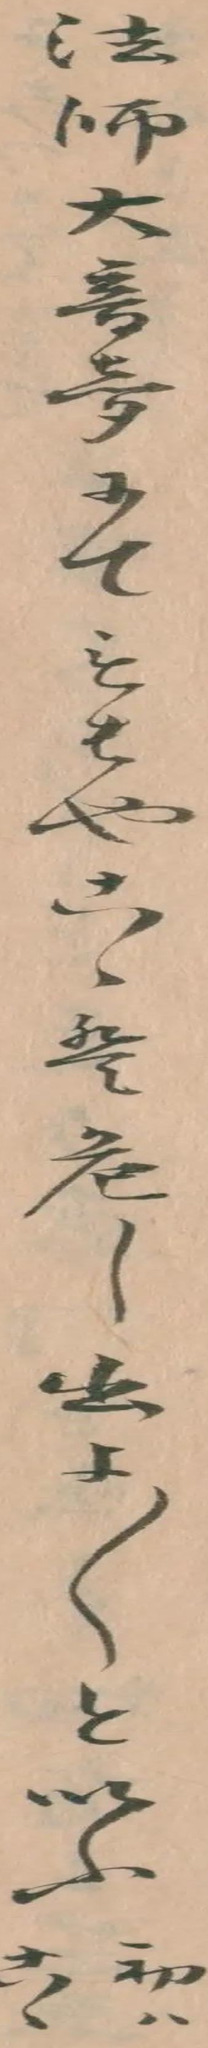法師大音声にてもはやこゝは危なし出よ〳〵といふ初ハこゝ

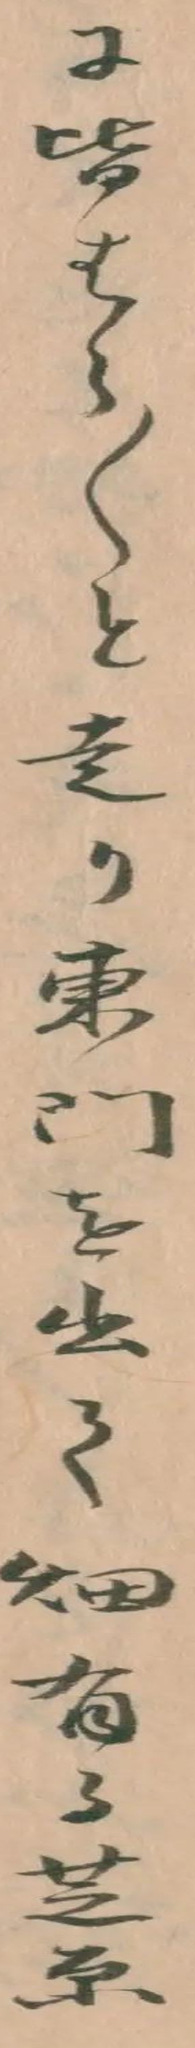に皆はら〳〵と走り東門を出て畑有る芝原
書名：地災撮要. 巻3(地震之部)-巻4(噴火之部)
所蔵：国立国会図書館 National Diet Library, JAPAN
